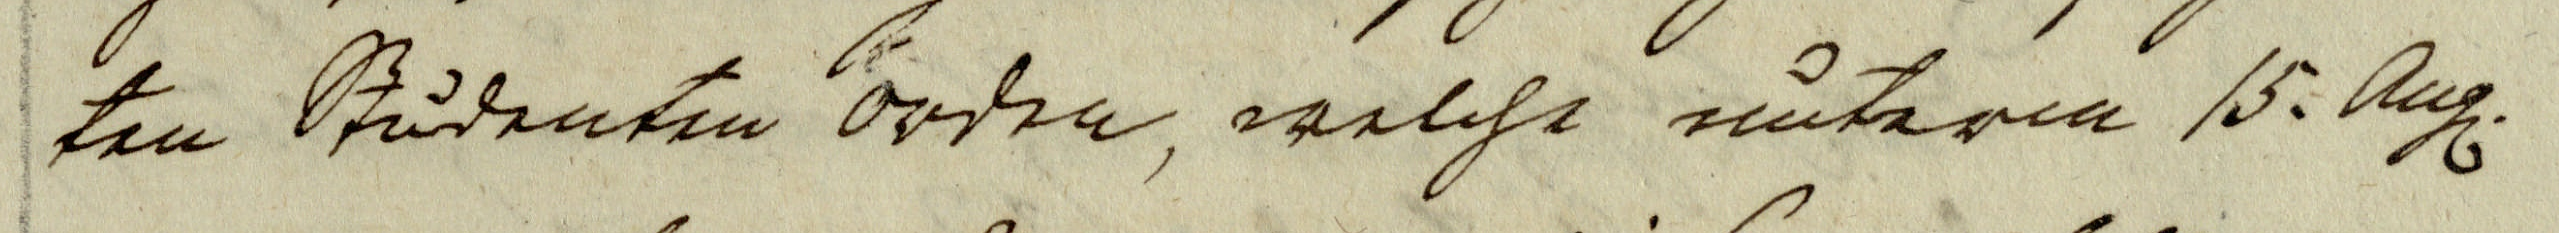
ten Studenten Orden, welche unterm 15. Aug.
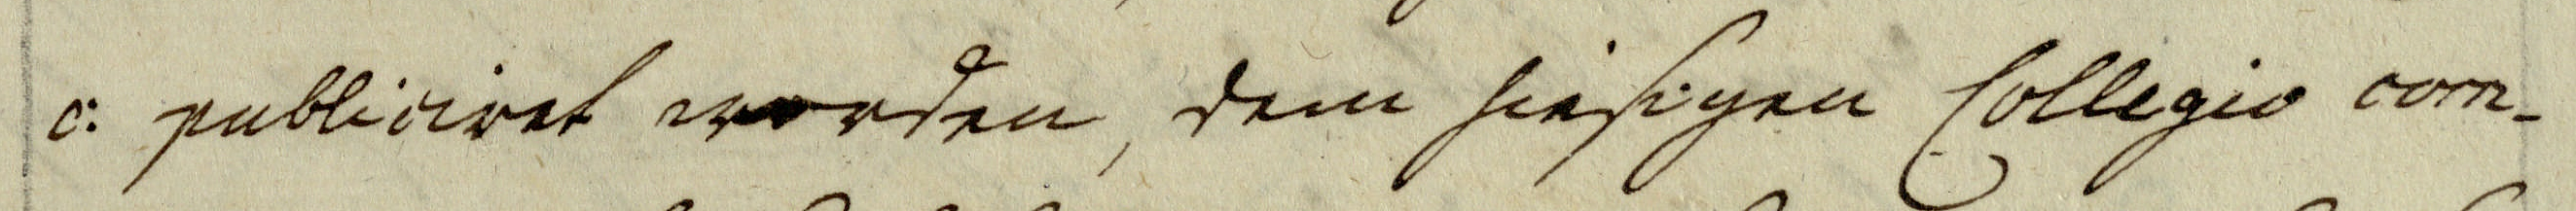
c: publiciret worden, dem hiesigen Collegio com¬
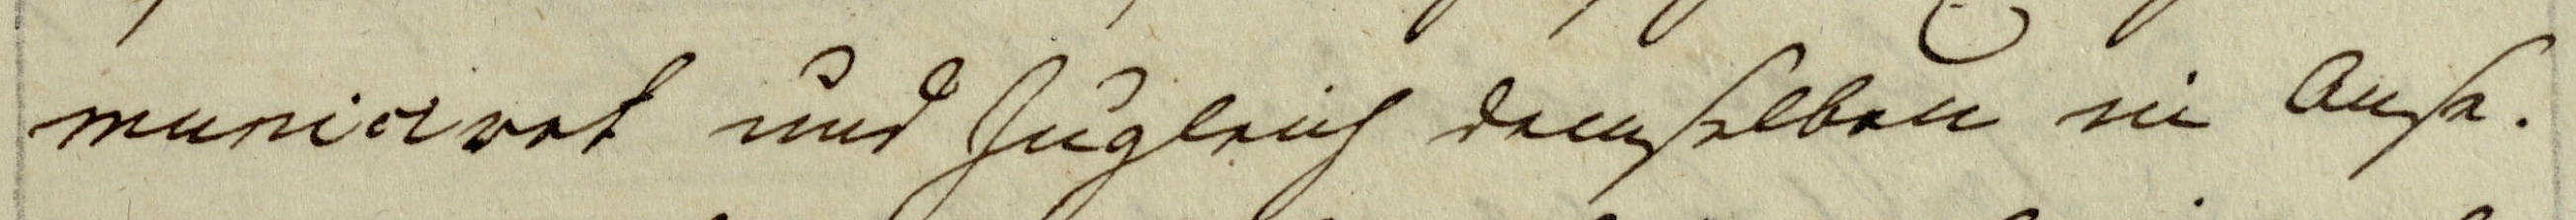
municiret und zugleich demselben in Anse¬
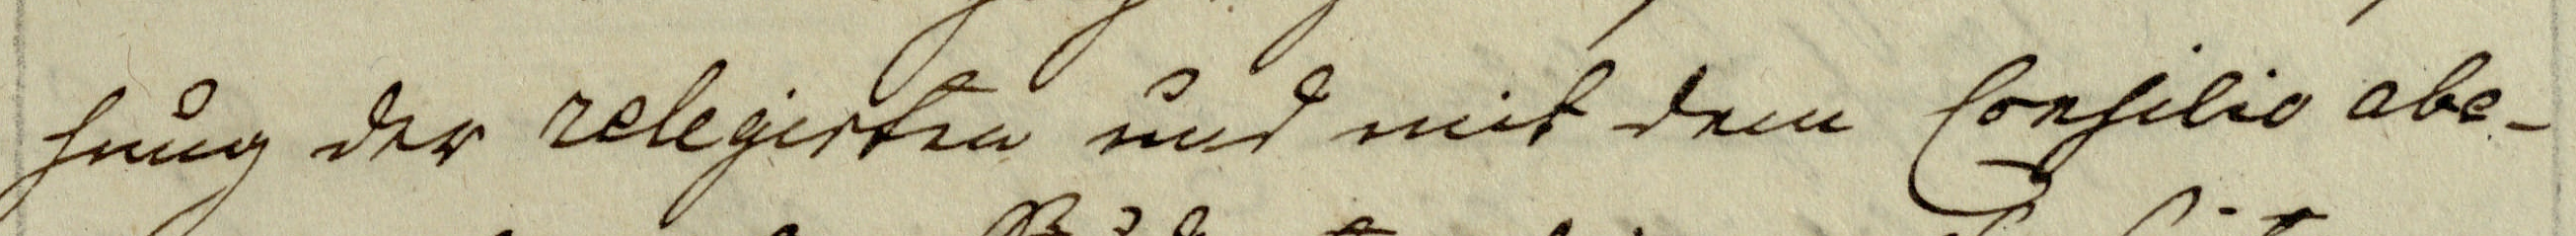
hung der relegirten und mit dem Consilio abe¬
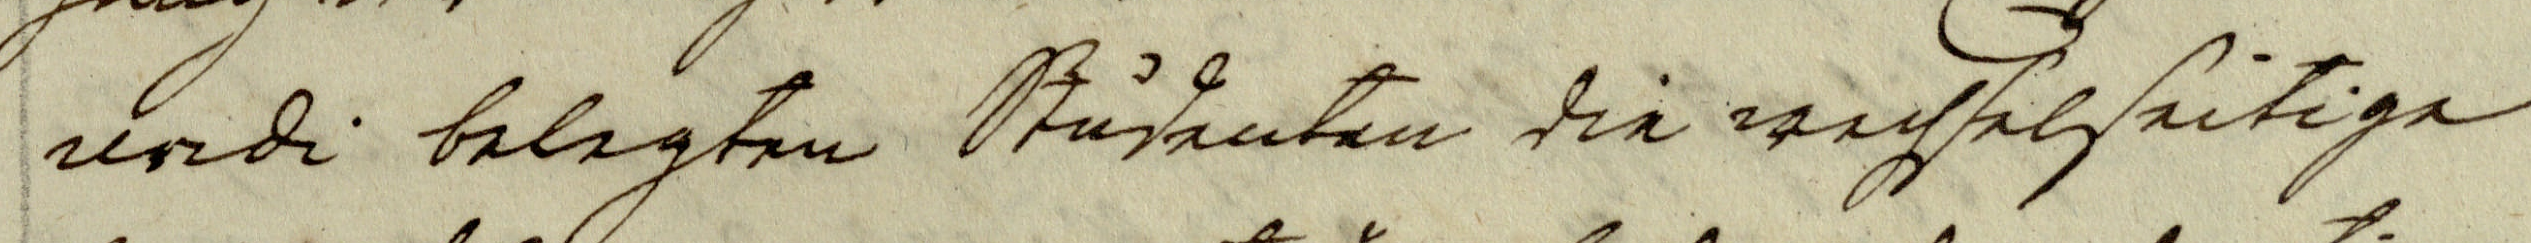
undi belegten Studenten die wechselseitige
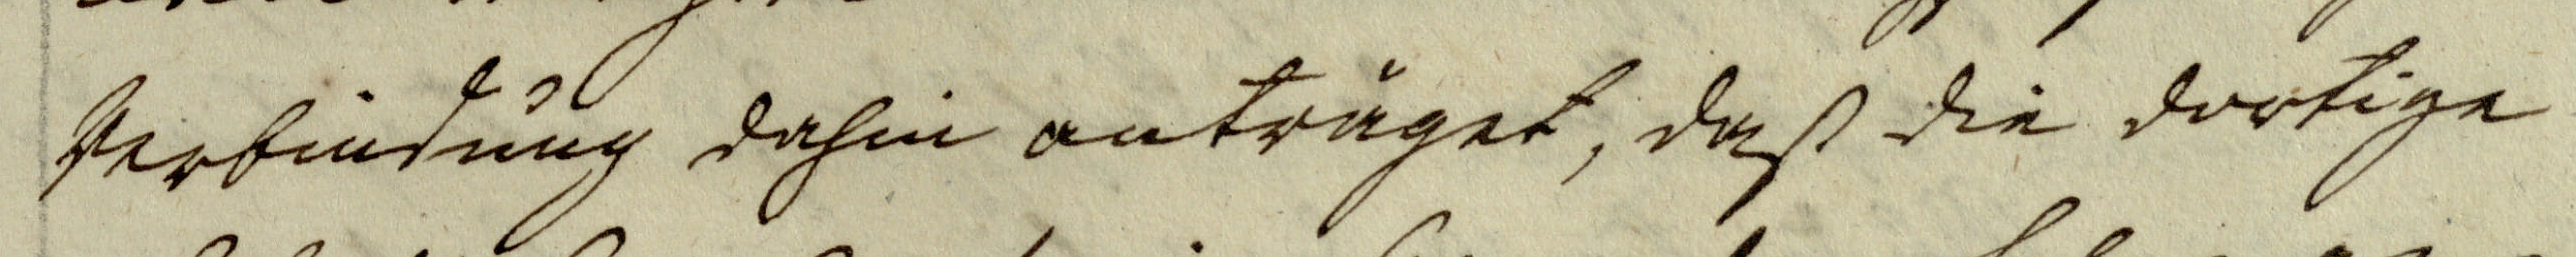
Verbindung dahin antrüget, daß die dortige
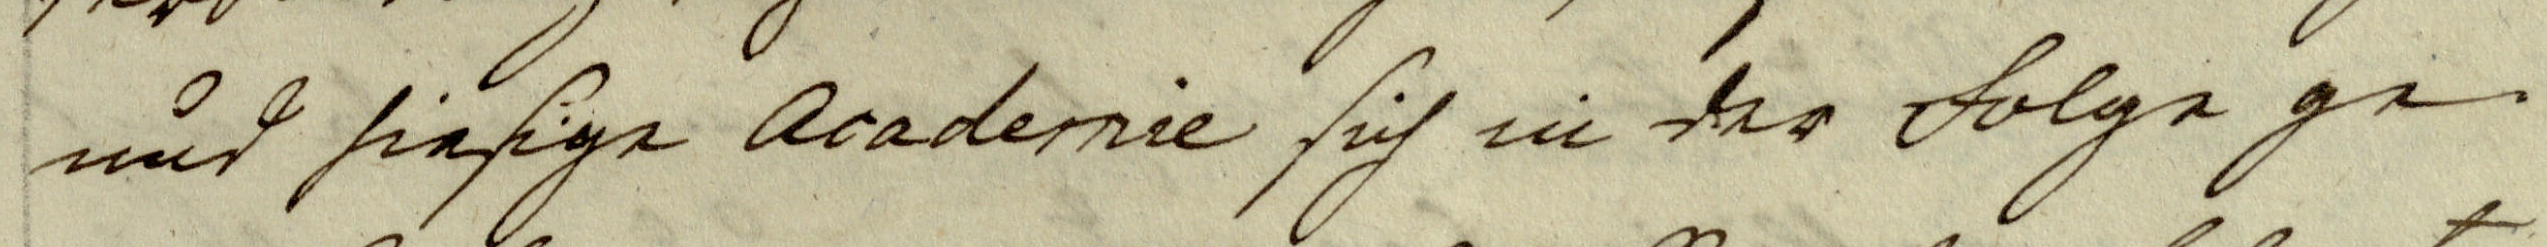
und hiesige Academie sich in der Folge ge¬
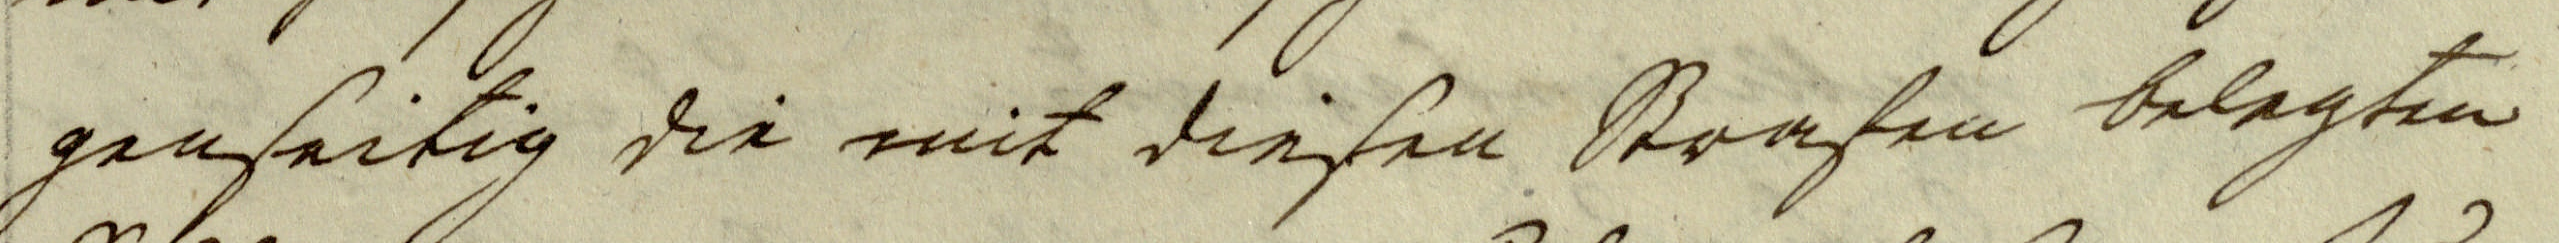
genseitig die mit diesen Strafen belegten
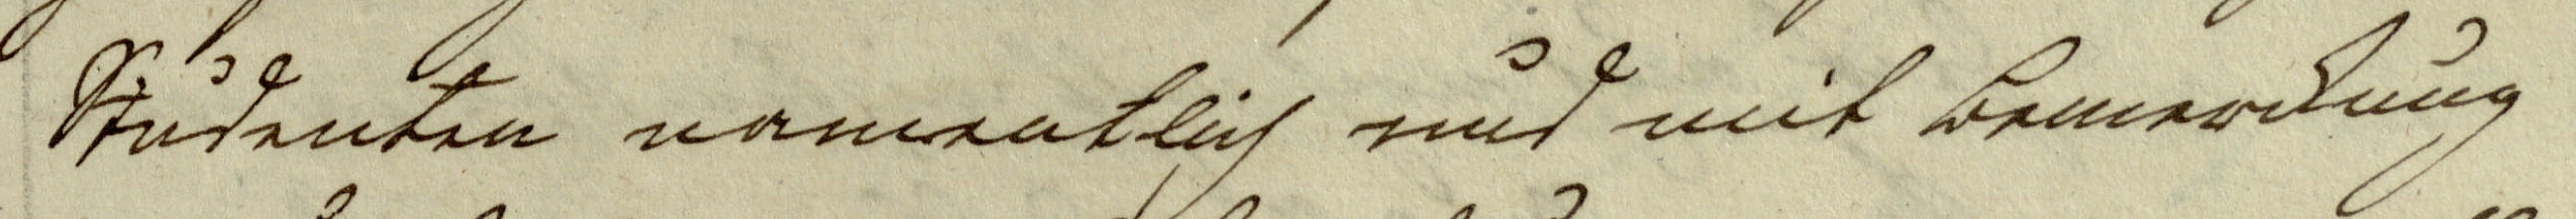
Studenten namentlich und mit Bemerckung
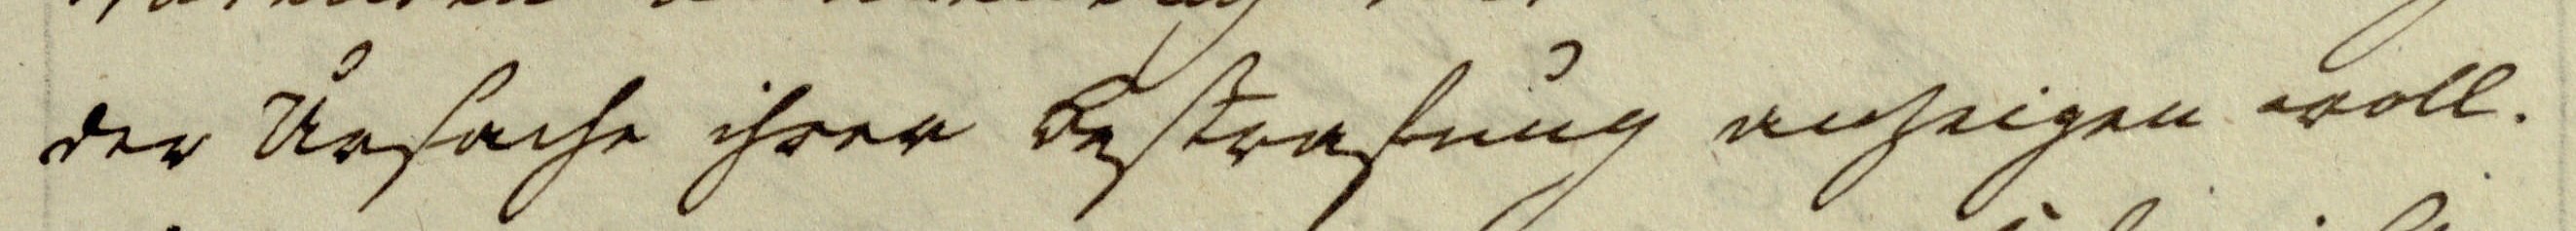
der Ursache ihrer Bestrafung anzeigen woll¬
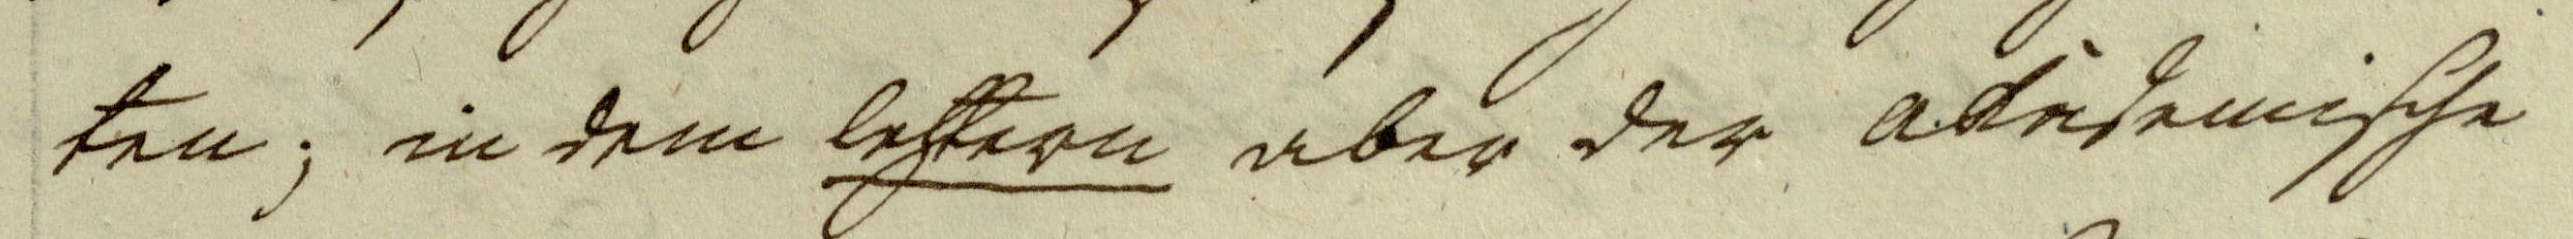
ten; in dem letztern aber der akademische
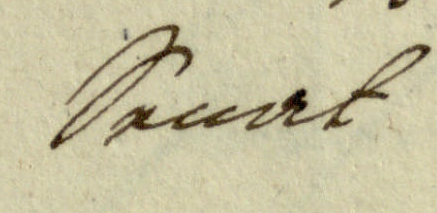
Senat
